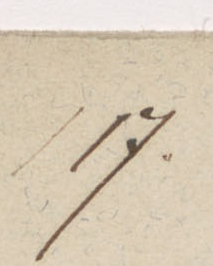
17.
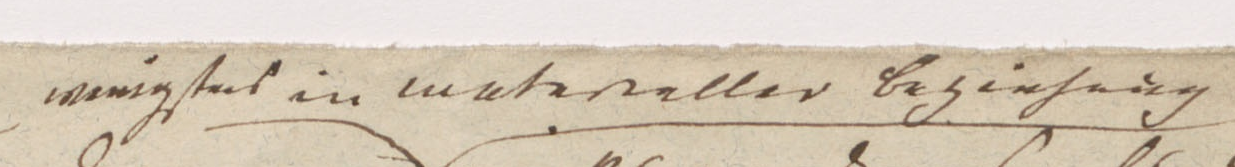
wenigstens in materieller Beziehung
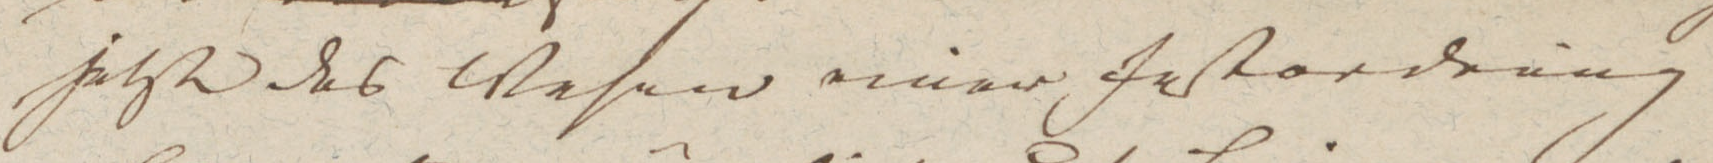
jetzt das Wesen einer Festordnung
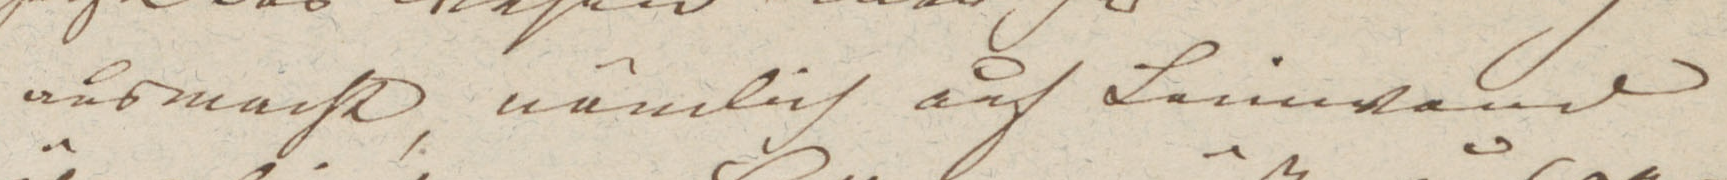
ausmacht, nämlich auf Leinwand
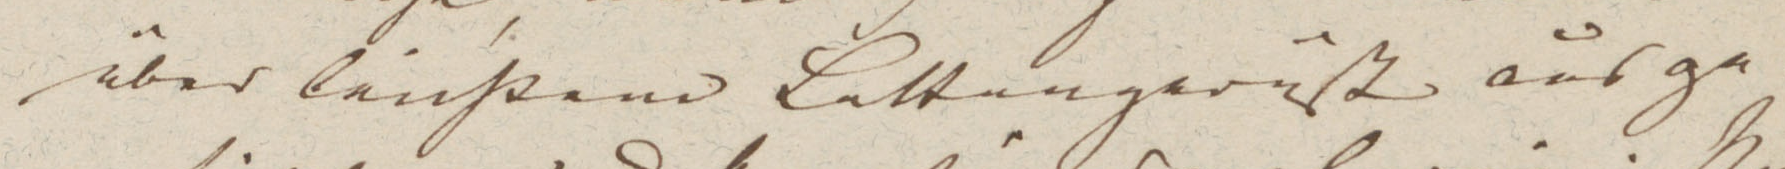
über leichtem Lattengerüst ausge-
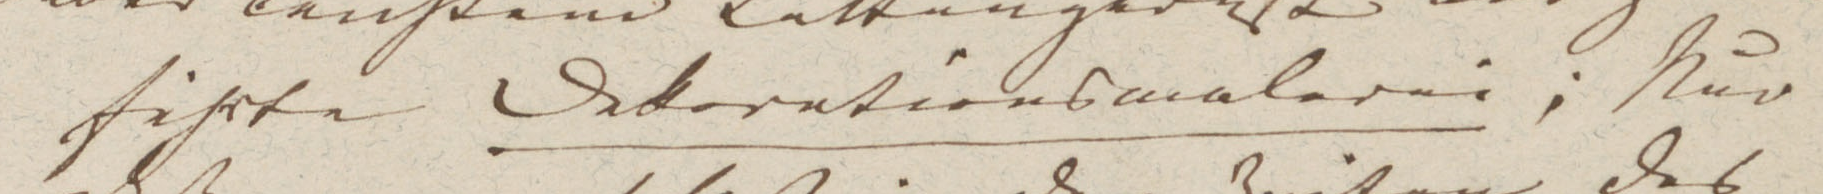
führte Dekorationsmalerei; Nur
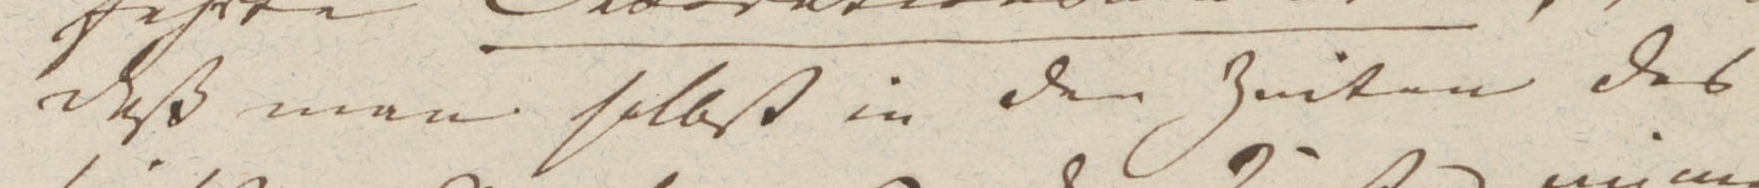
dass man selbst in den Zeiten des
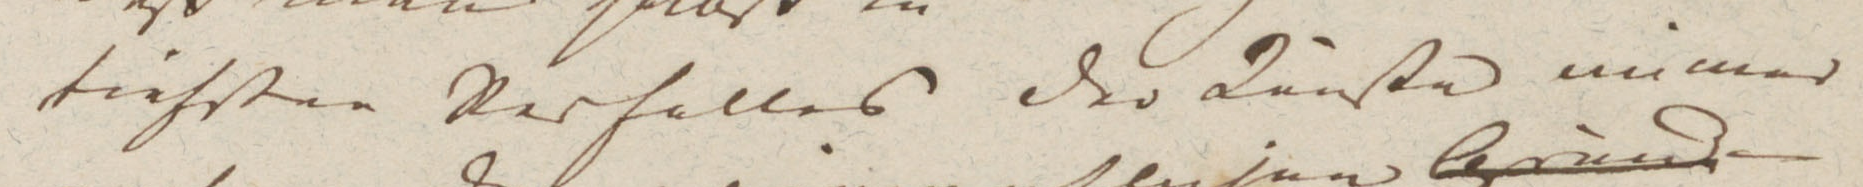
tiefsten Verfalles der Künste immer
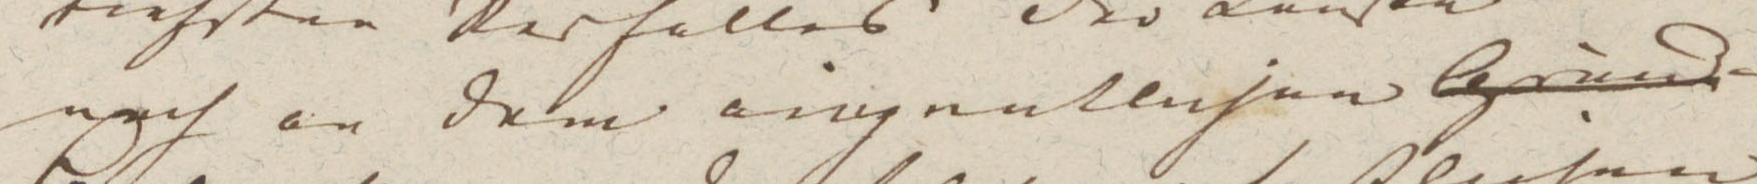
noch an dem eientlichen Grund-
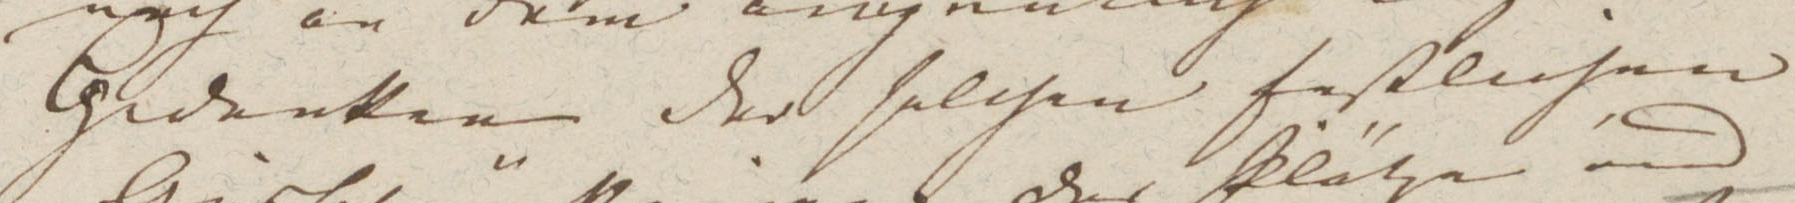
Gedanken der solchen festlichen
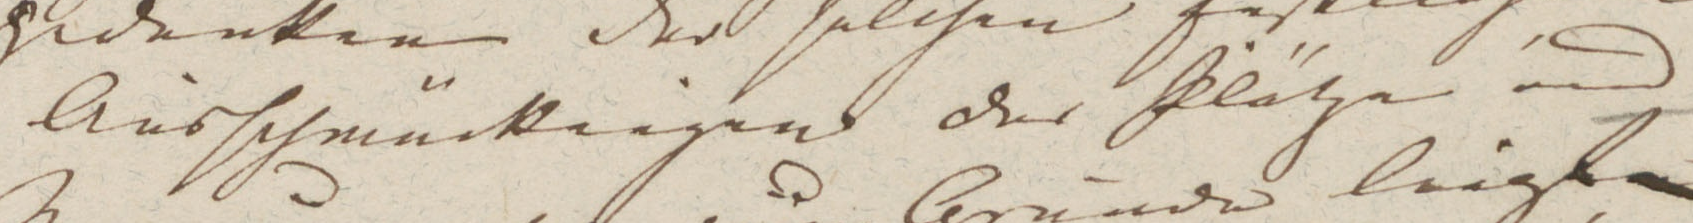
Ausschmückungen der Plätze und %
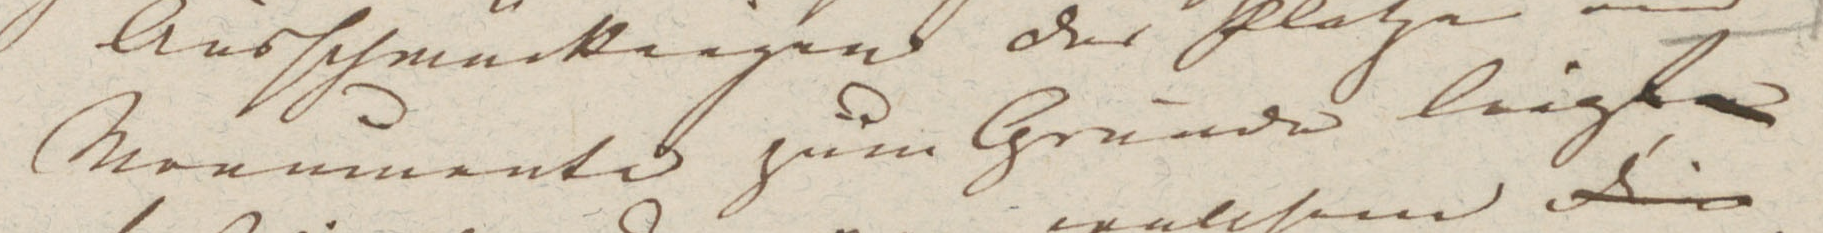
Monumente zum Grunde liegent,
